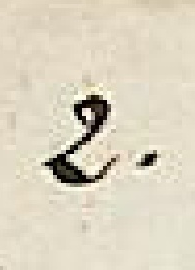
2
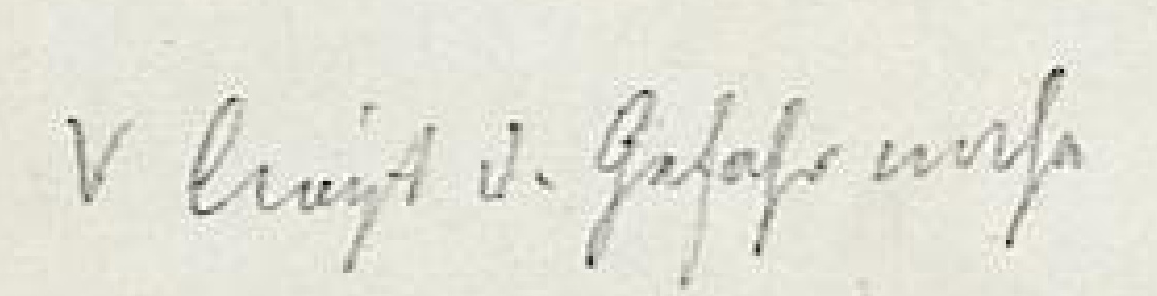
V liegt d. Gefahr nahe
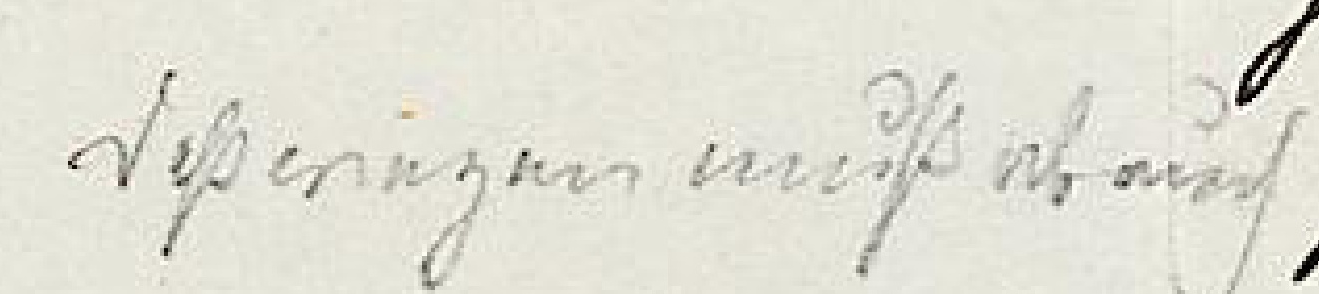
daß ewigen muß ab. auchh
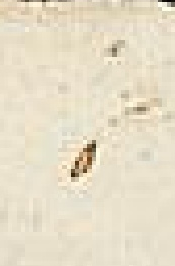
2
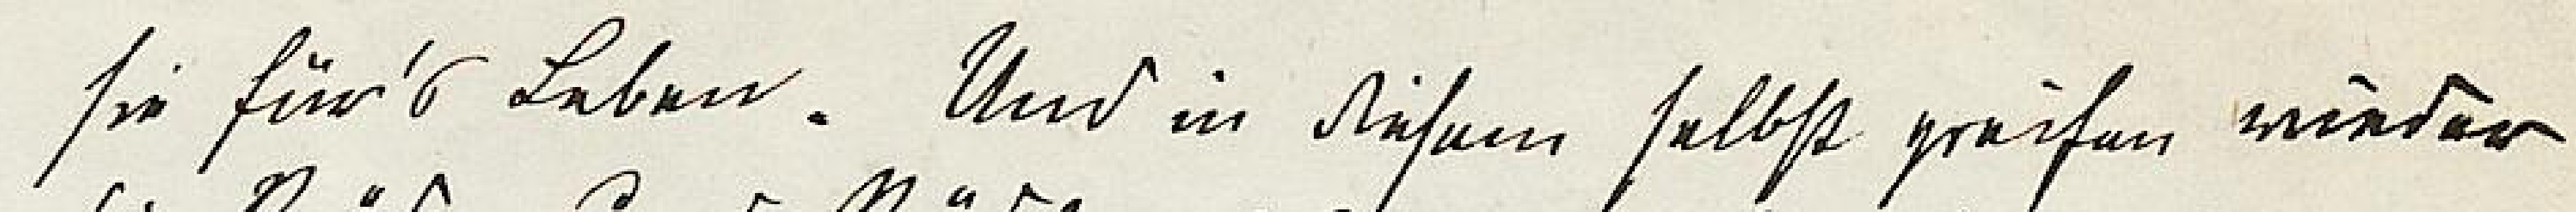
sie für's Leben. Und in diesem selbst greifen wieder
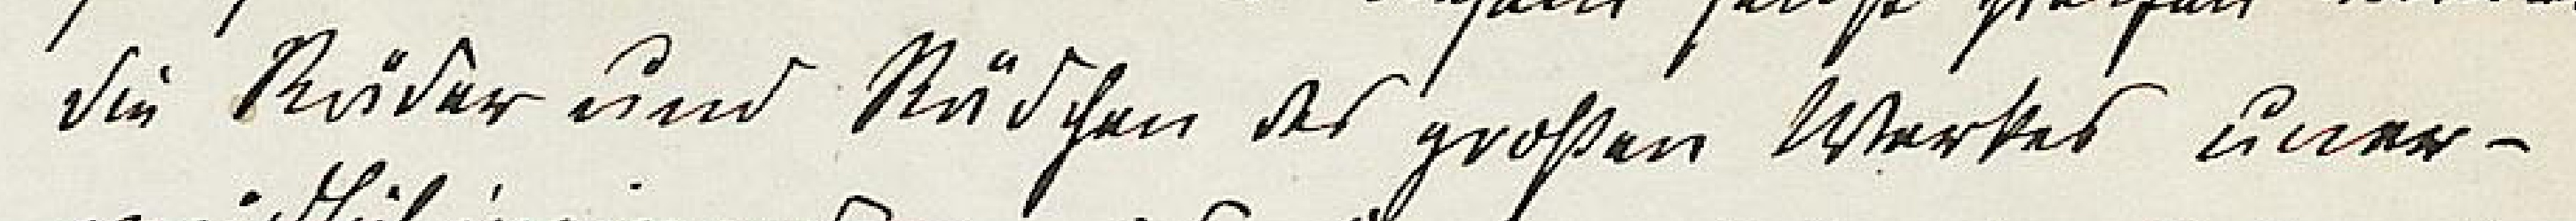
die Räder und Rächen des großen Werkes uner¬
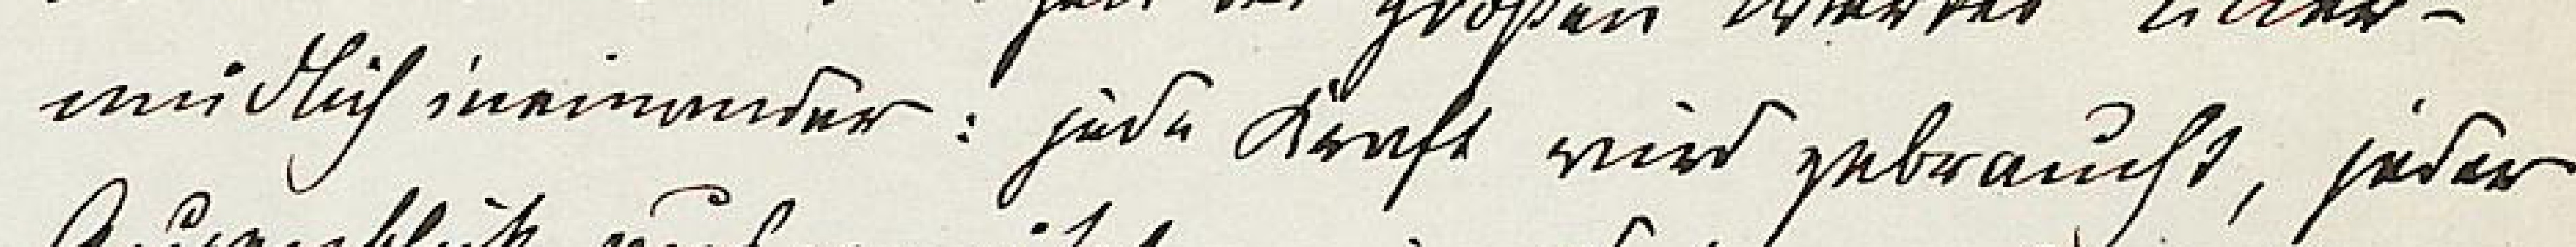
müdlich ineinander: jede Kraft wird gebraucht, jeder
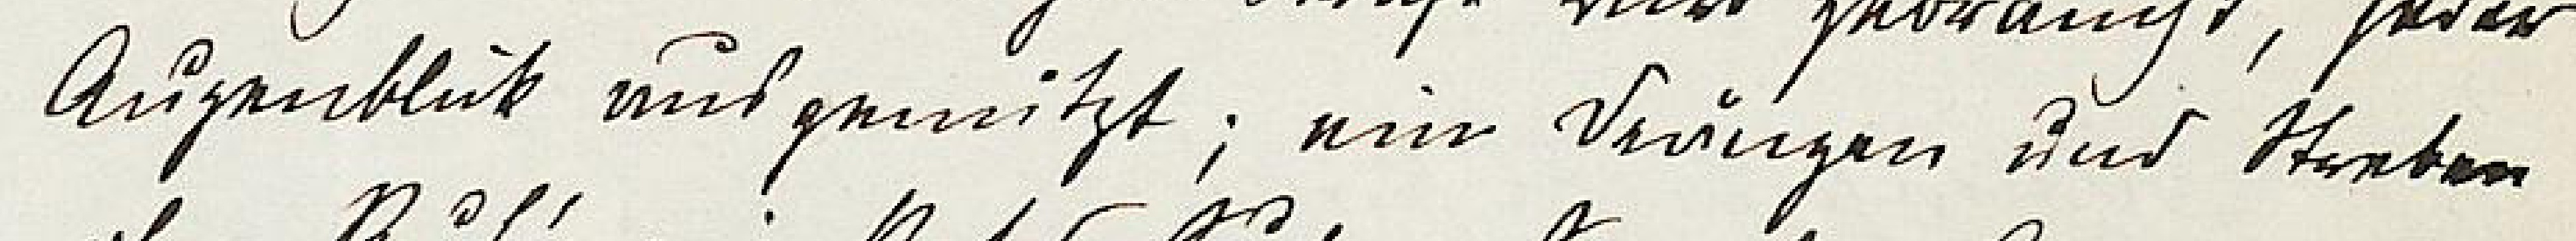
Augenblick ausgenützt; ein Drängen und Streben
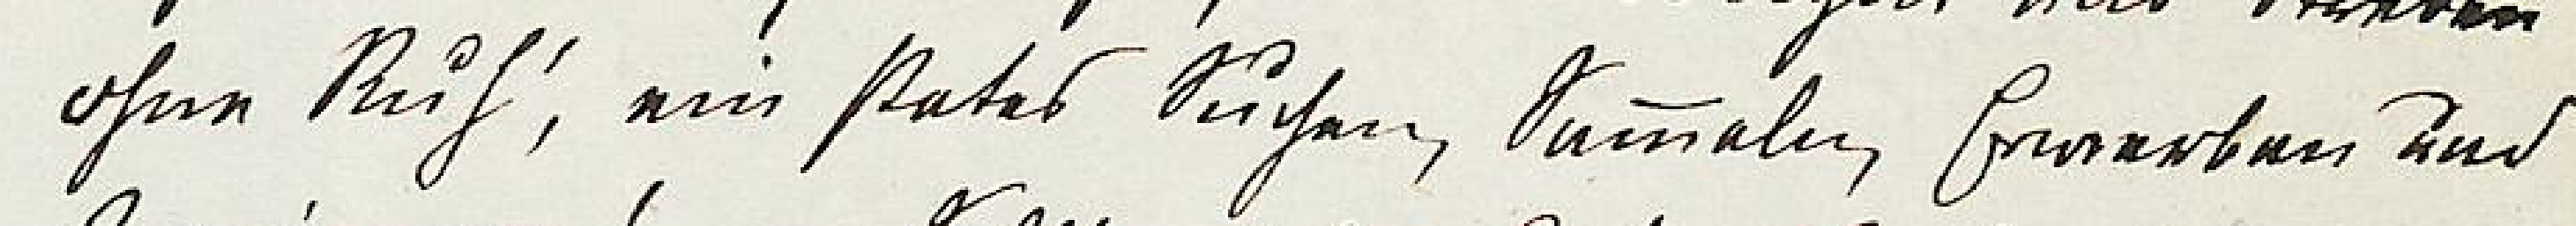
ohne Ruh', ein stetes Suchen, Sammeln, Erwerben und
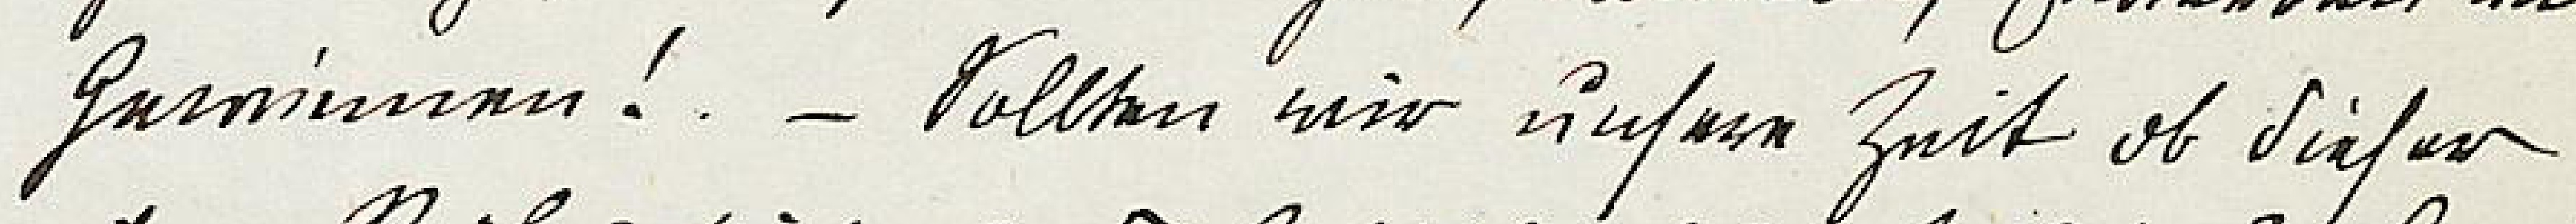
Gewinnen! _ Sollten wir unsere Zeit ob dieser
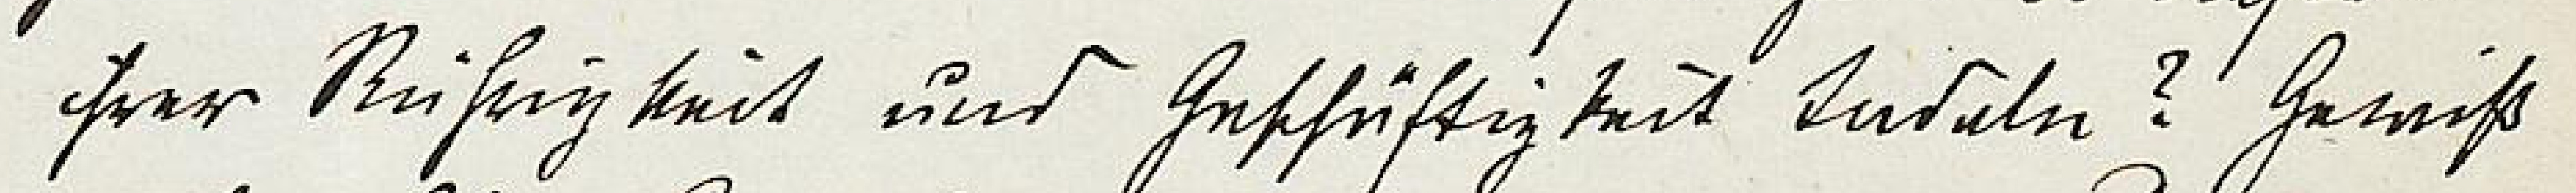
ihrer Rührigkeit und Geschäftigkeit tadeln? Gewiß
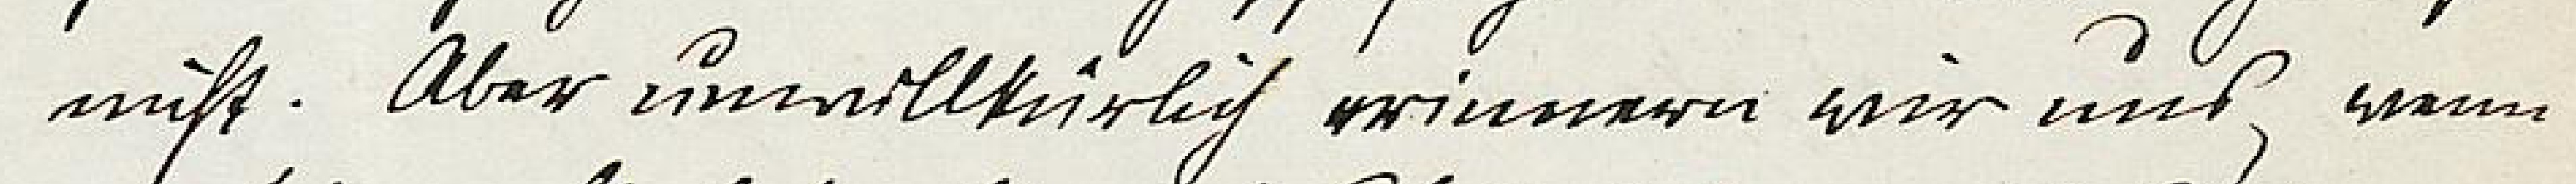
nicht. Aber unwillkürlich erinnern wir uns, wenn
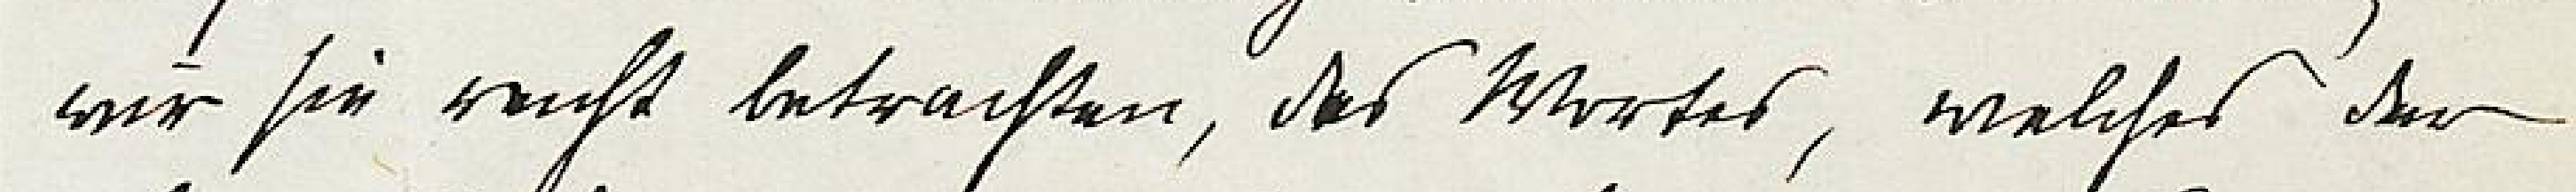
wir sie recht betrachten, des Wortes, welches der
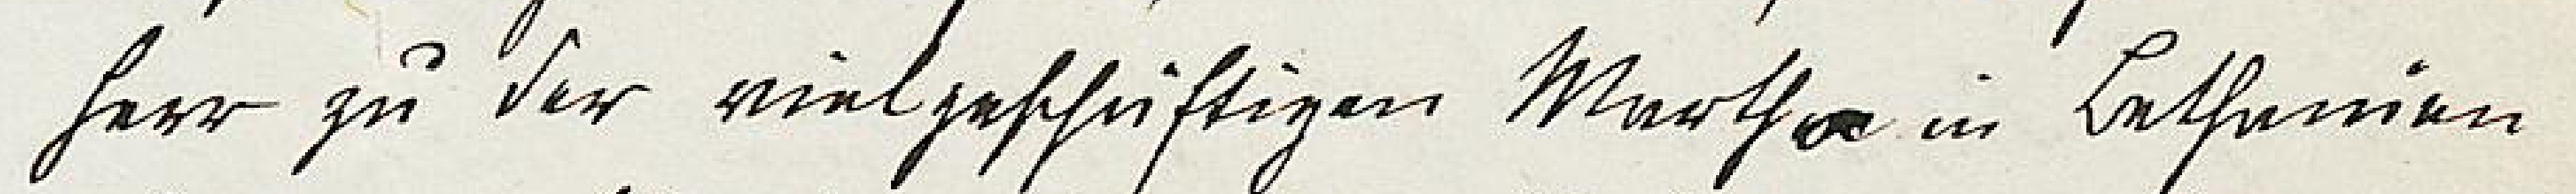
Herr zu der vielgeschäftigen Martha in Bethanien
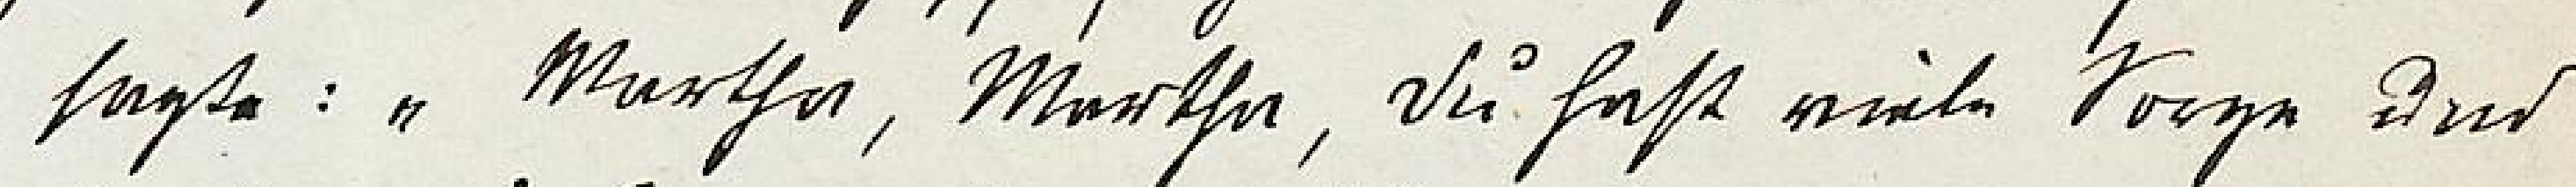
sagte: "Martha, Martha, du hast viele Sorgen und
